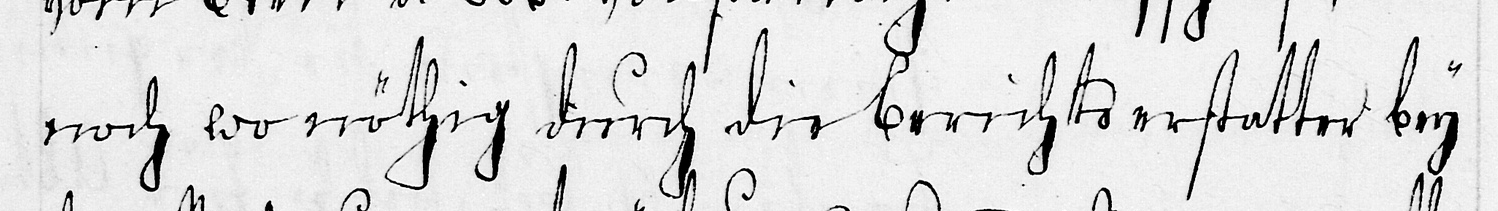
noch wo nöthig durch die Berichtserstatter bey
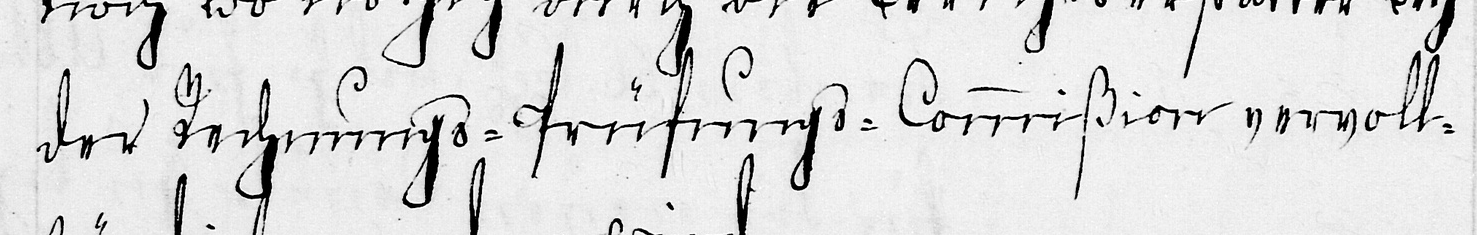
der Rechnungs-Prüfungs-Commißion vervoll¬
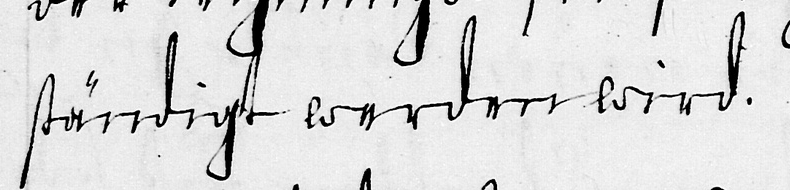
ständigt werden wird.
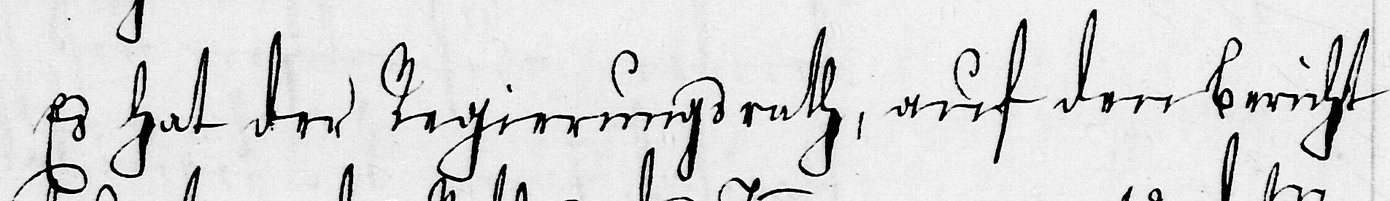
Es hat der Regierungsrath, auf den Bericht
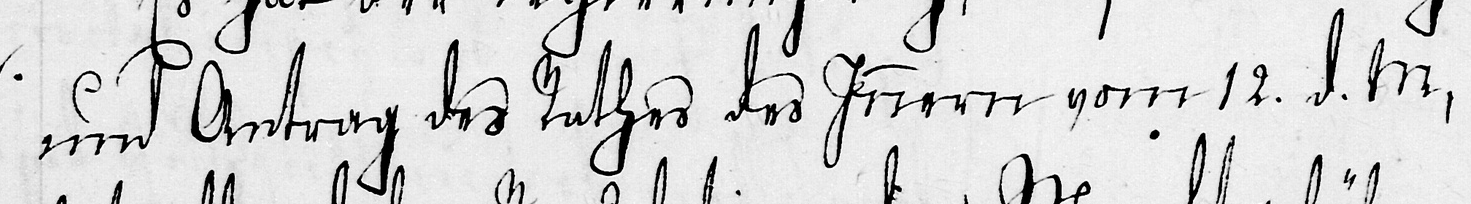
und Antrag des Rathes des Innern vom 12. d. M.,
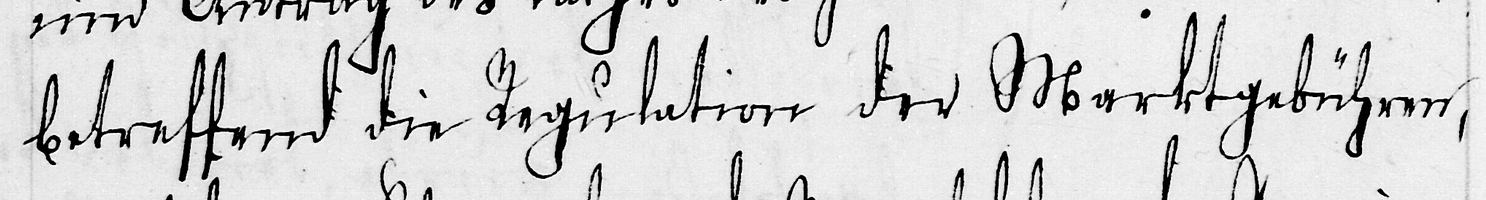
betreffend die Regulation der Marktgebühren,
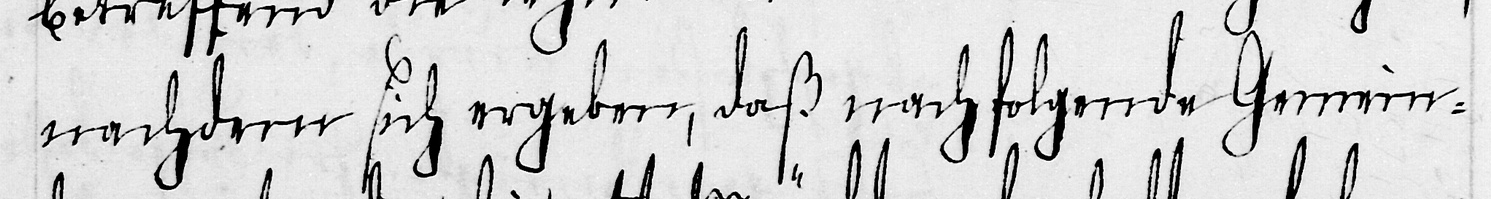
nachdem sich ergeben, daß nachfolgende Gemein¬
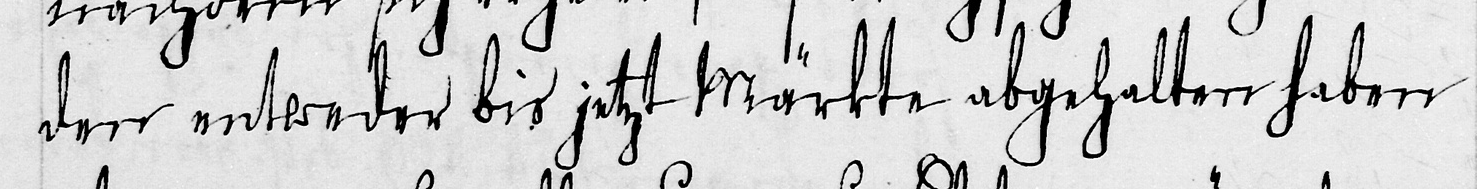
den entweder bis jetzt Märkte abgehalten haben
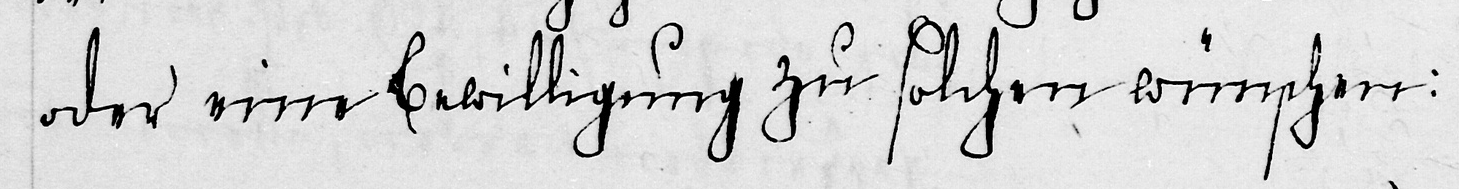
oder eine Bewilligung zu solchen wünschen:
